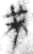某
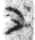之
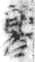○（攝）
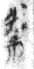○（幣）
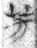芳
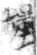糧
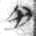甶（思）
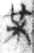某
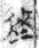逨（來）
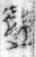歸
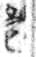○（食）
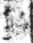故
